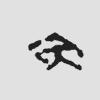夭
